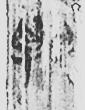與
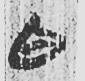白
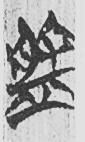盤
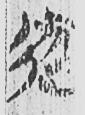迖
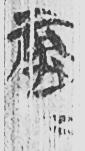坪=
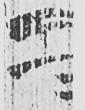王=
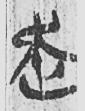走
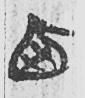西
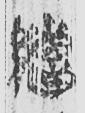{糸東田}
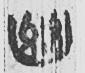幽
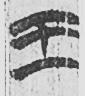王
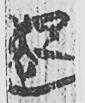起
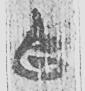𠂤
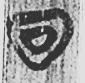回
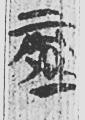坪
